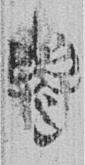○（舉）
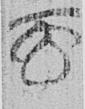而（爾）
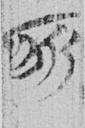所
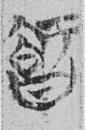○（知）
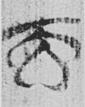而（爾）
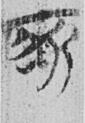所
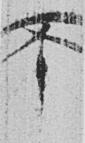不
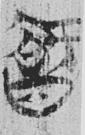○（知）
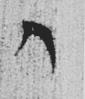人
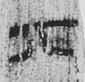亓（其）
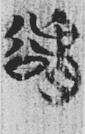○（舍）
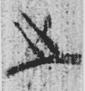之
